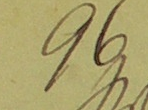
96
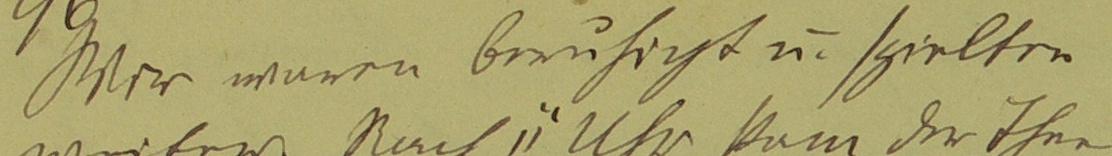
wir waren beruhigt und spielten
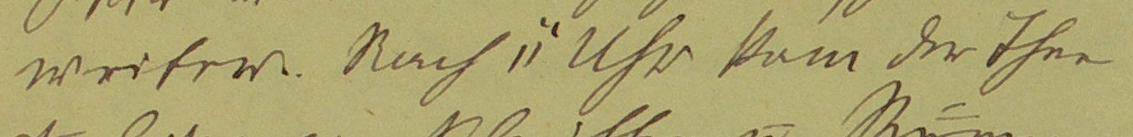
weiter. Nach 11 Uhr kam der Thee
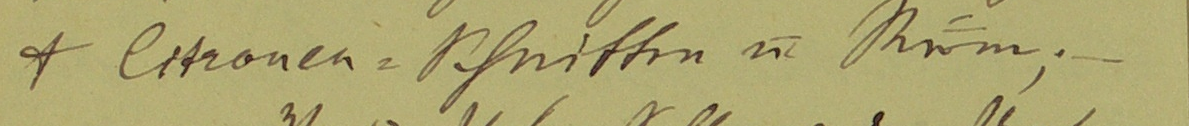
mit Citronenen =Schnitten und Rum;-
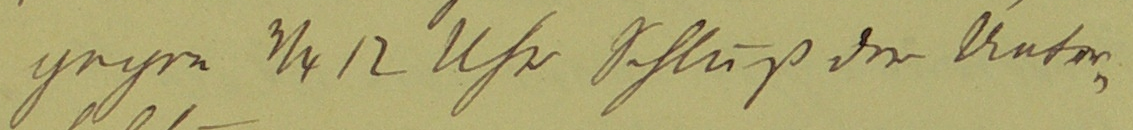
gegen ¾ 12 Uhr Schluss der Unter¬
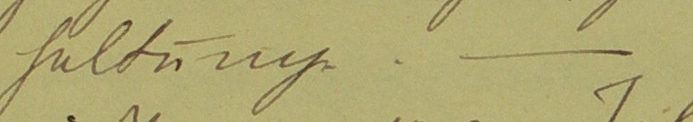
haltung.
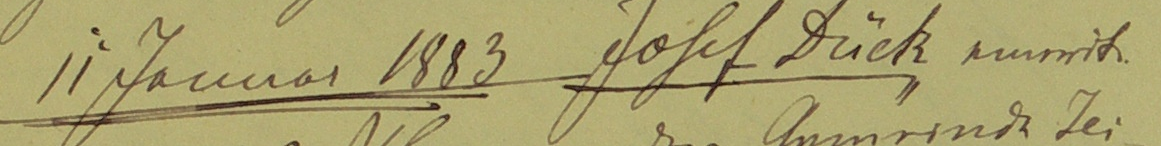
11. Januar 1883 Josef Dück . Emeritierter
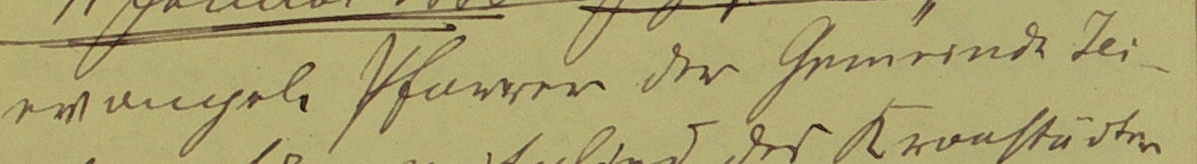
evangelischer Pfarrer der Gemeinde Zei¬
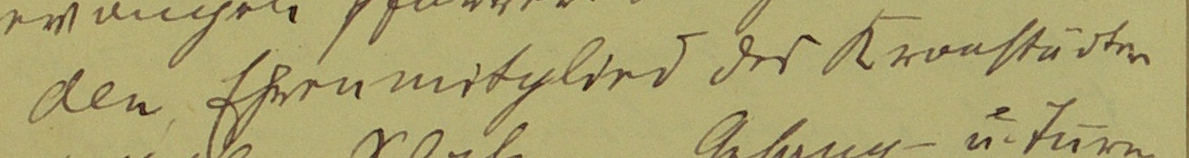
den, Ehrenmitglied der Kronstädter
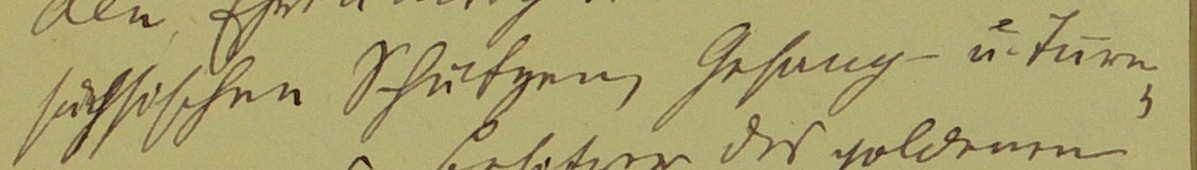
sächsischen Schützen, Gesang- und Turn¬
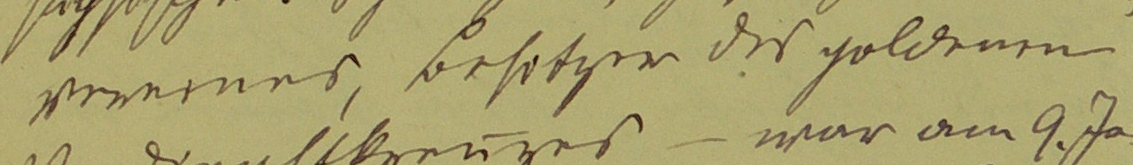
verein, Besitzer des goldenen
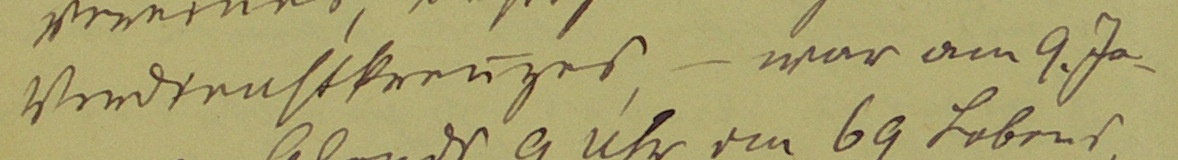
Verdienstkreuzes,- war am 9. Ja¬
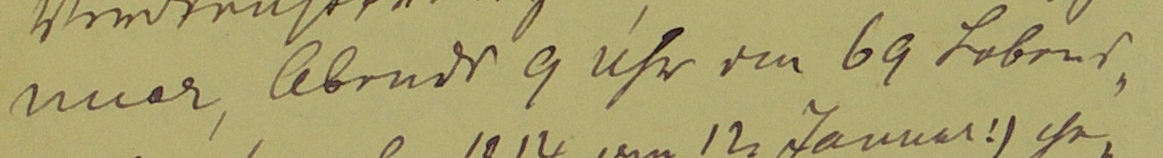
nuar, Abends 9 Uhr im 69 Lebens¬
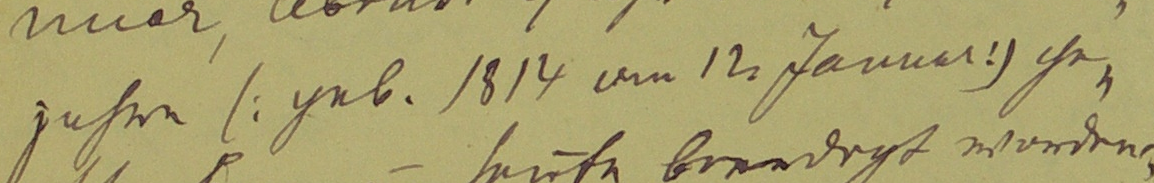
jahr ( geb: 1814 am 12 Januar ! ) ge¬
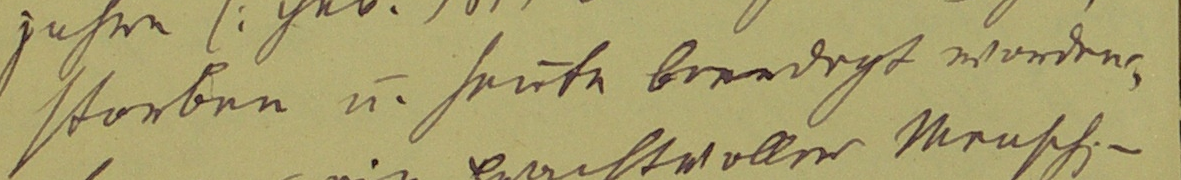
storben und heute beerdigt worden.
